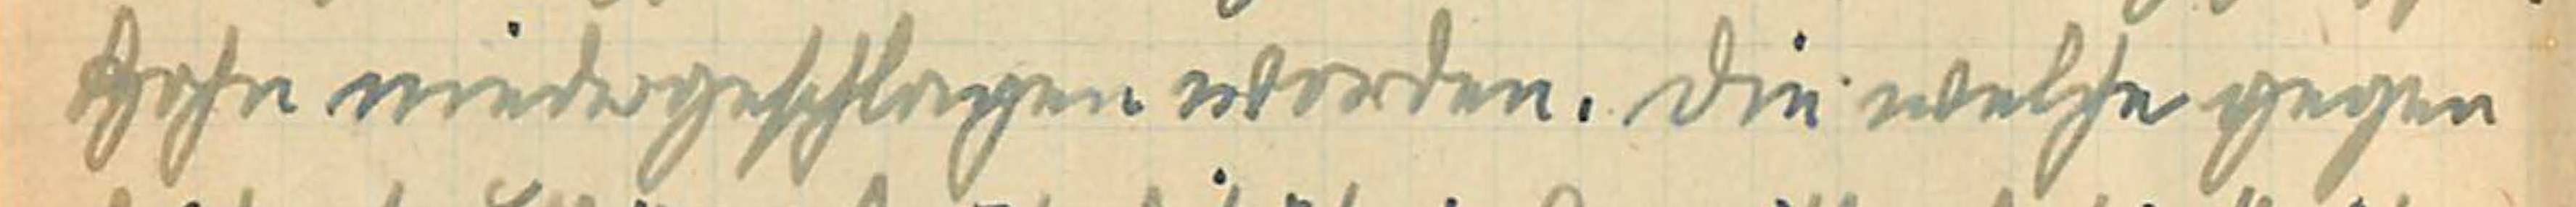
Hohn niedergeschlagen worden. Die welche gegen
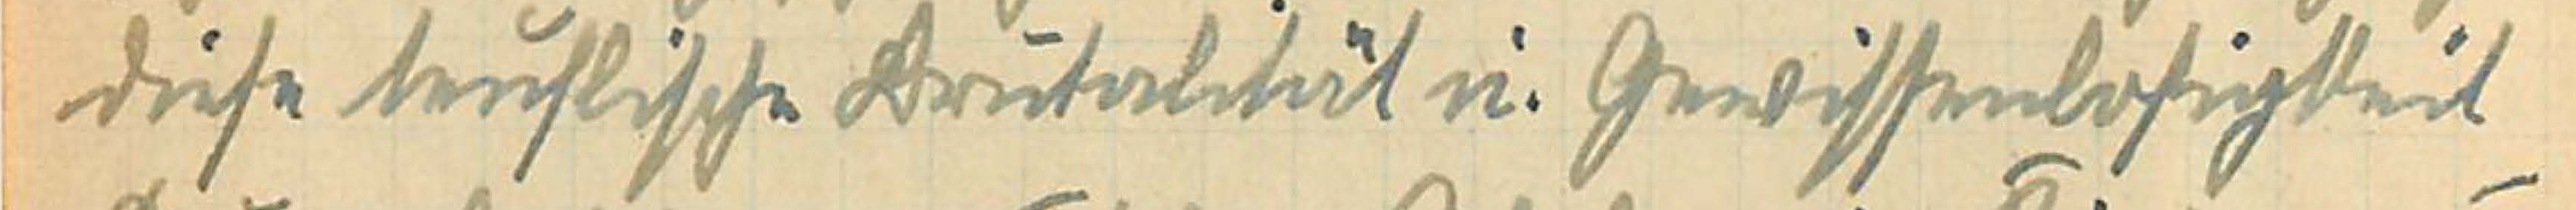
diese teuflische Brutalität u. Gewissenlosigkeit
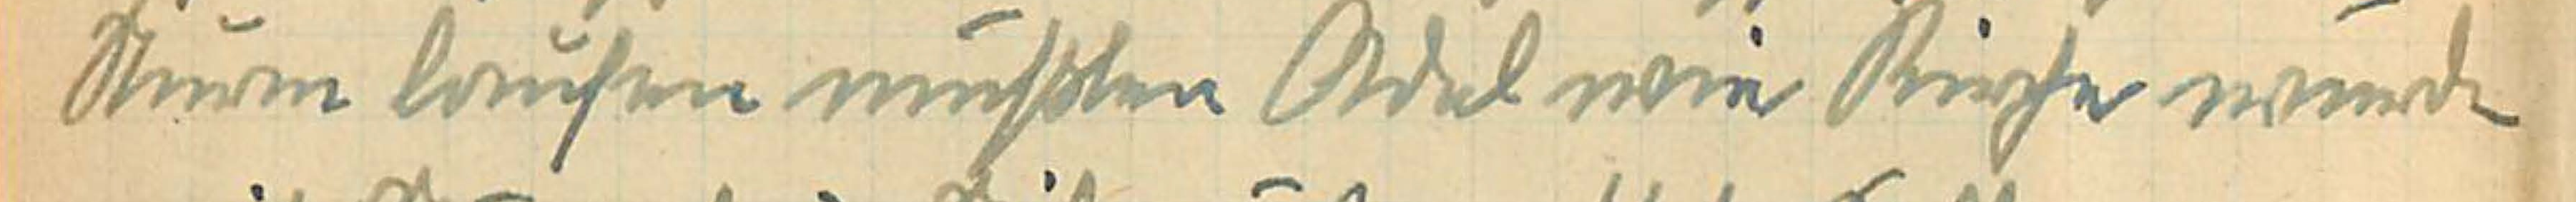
Sturm laufen mußten Adel wie Kirche wurden
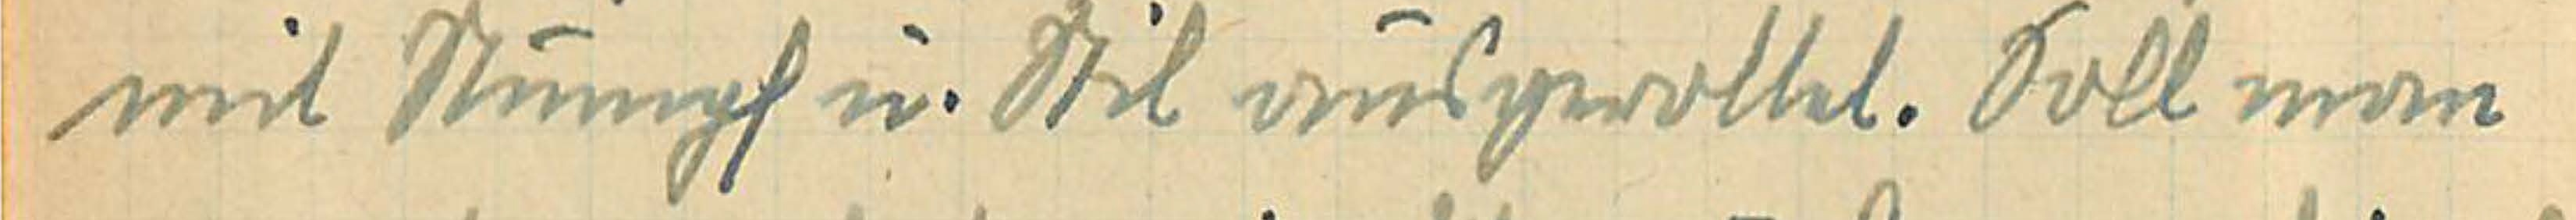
mit Stumpf u. Stil ausgerottet. Soll man
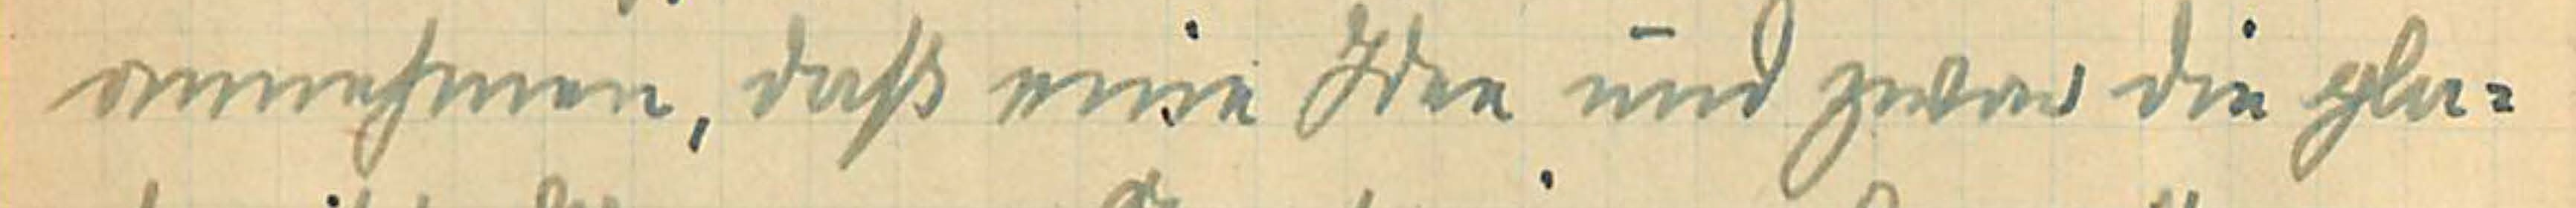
annehmen, daß eine Idee und zwar die pla-
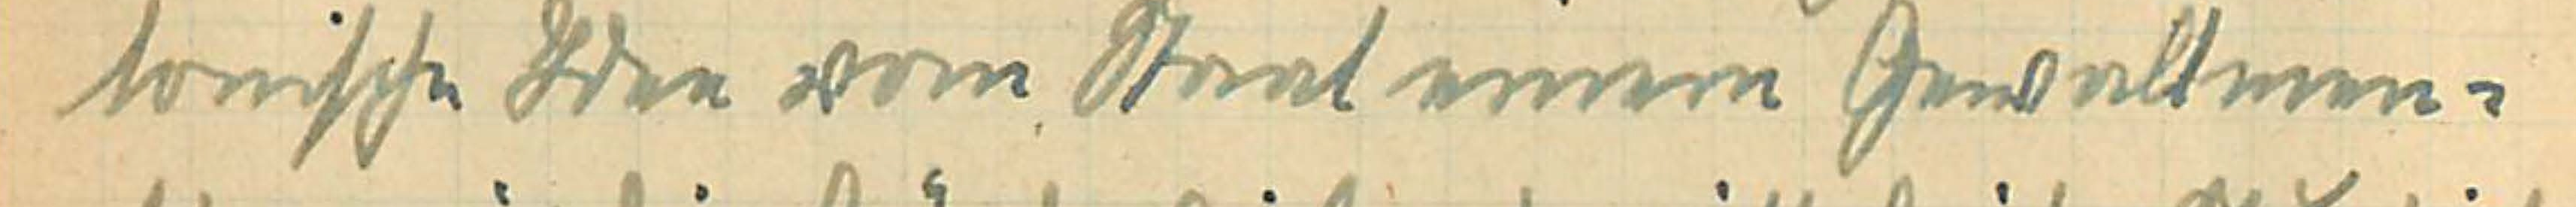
tonische Idee vom Staat einem Gewaltmen-
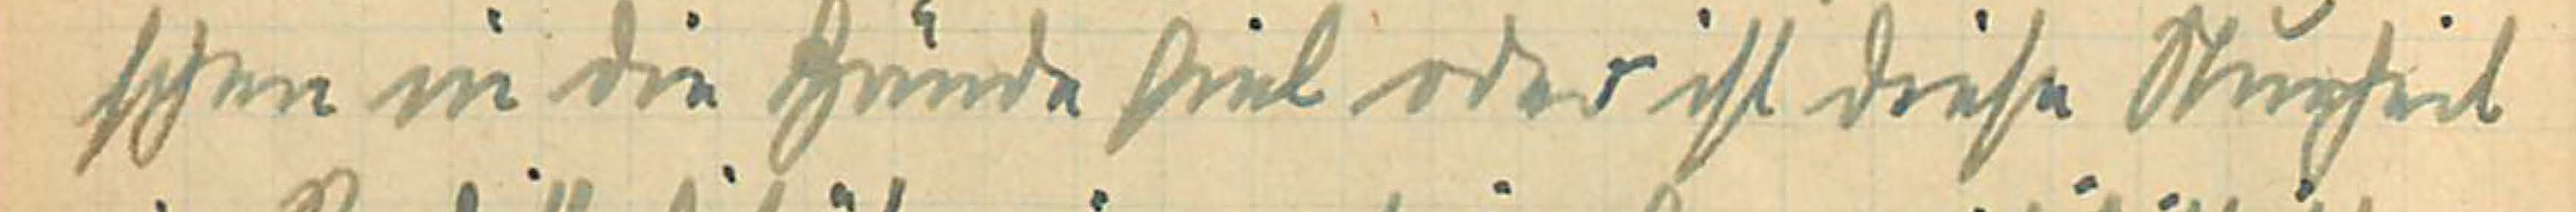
schen in die Hände fiel oder ist diese Sturheit
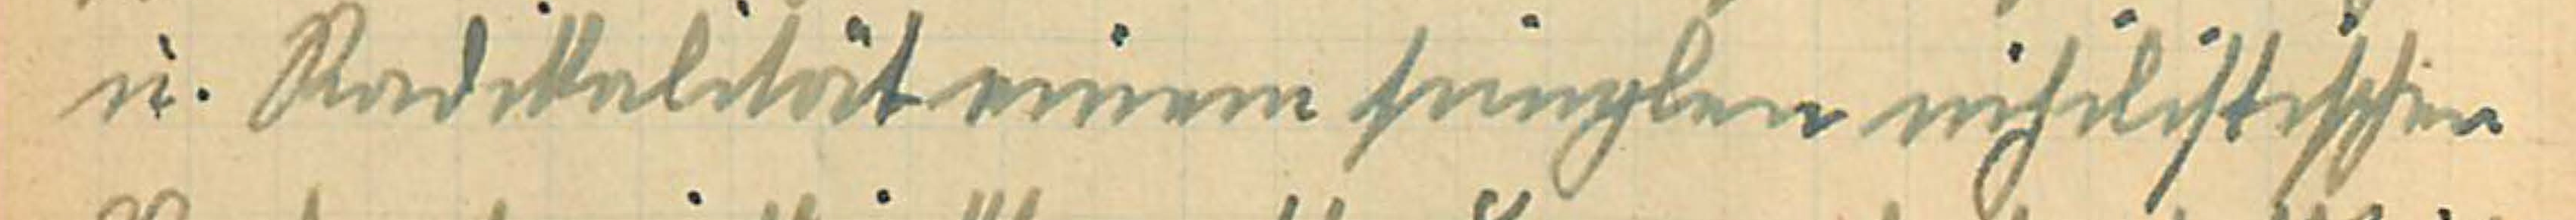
u. Radikalität einem simplen nihilistischen
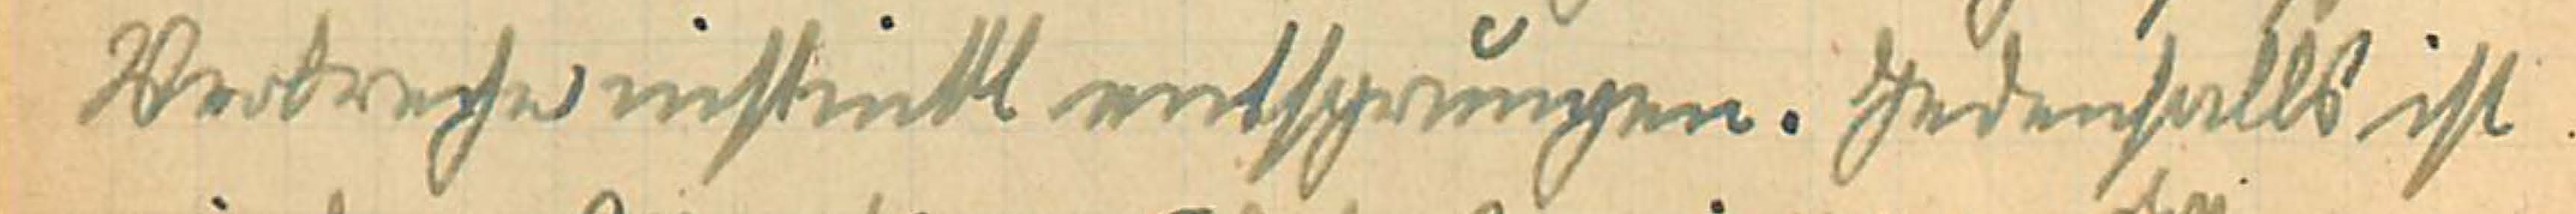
Verbrecherinstinkt entsprungen. Jedenfalls ist
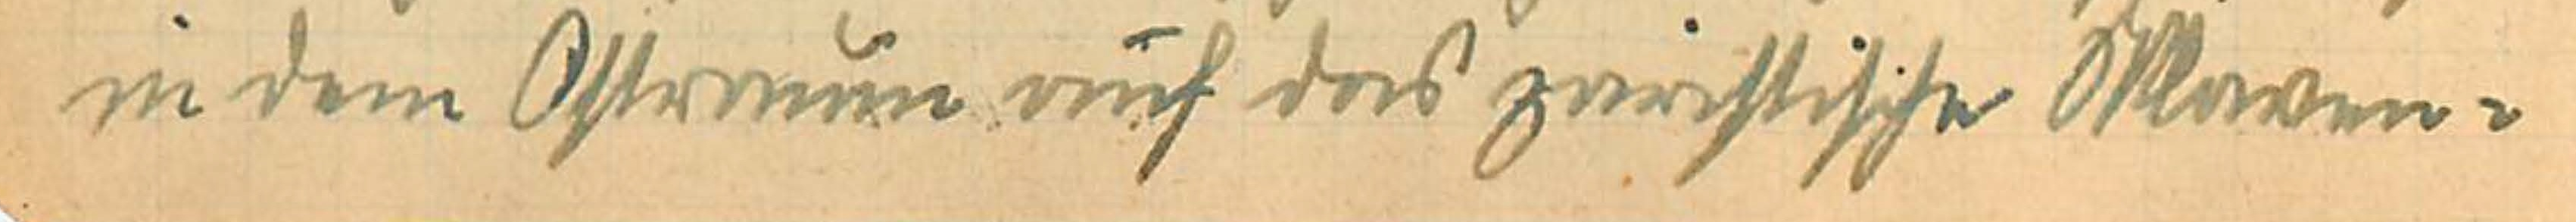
in dem Ostraum auf das zaristische Sklaven-
